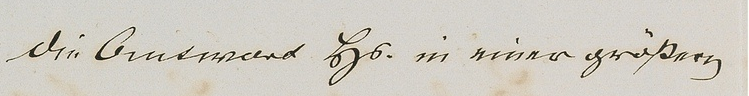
die Antwort Hs. in einer größern
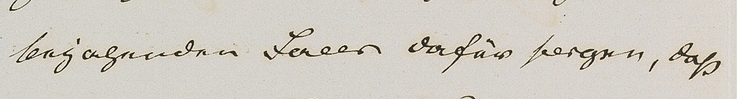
bejahenden Falls dafür sorgen, daß
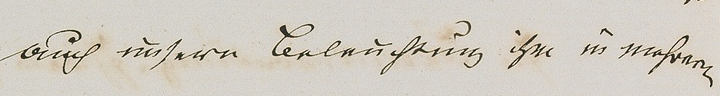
auch unsere Beleuchtung ihm in mehrern
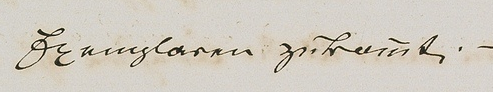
Exemplaren zukommt. –
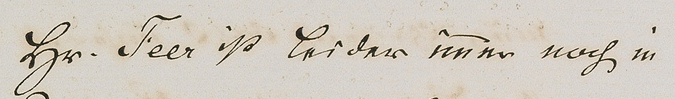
Hr. Feer ist leider immer noch in
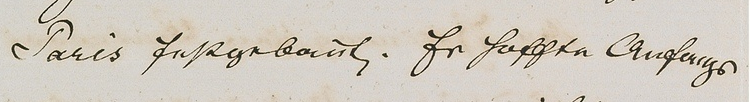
Paris festgebannt. Er hoffte Anfangs
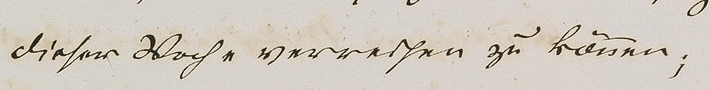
dieser Woche verreisen zu können;
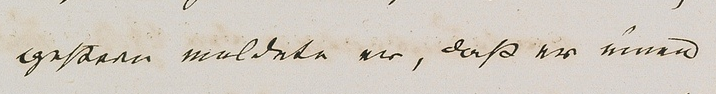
gestern meldete er, daß er einen
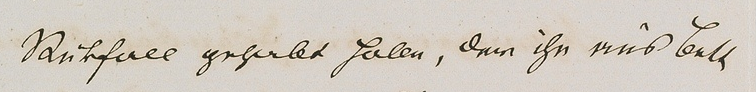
Rükfall gehabt habe, der ihn an's Bett
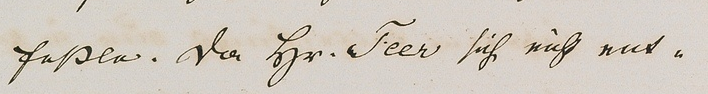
feßle. Da Hr. Feer sich nicht ent-
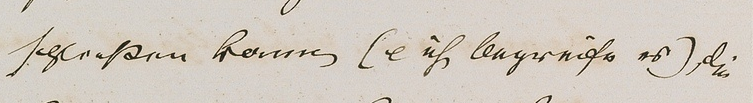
schließen kann (& ich begreife es), die
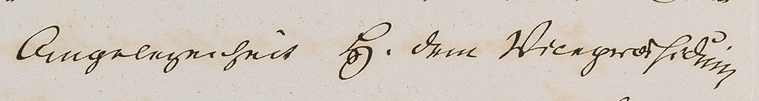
Angelegenheit H. dem Vicepräsidium
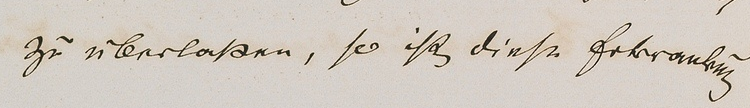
zu überlaßen, so ist diese Erkrankung
